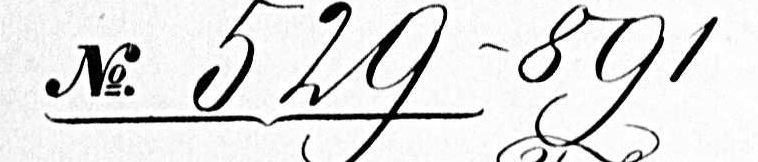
No. 529 – 1891
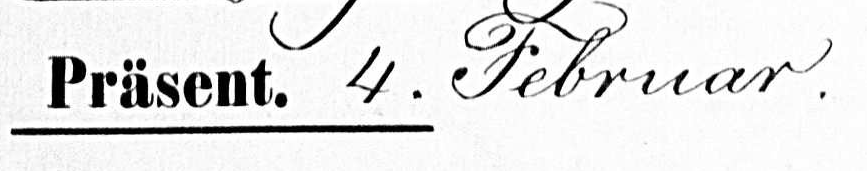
Präsent. 4. Februar
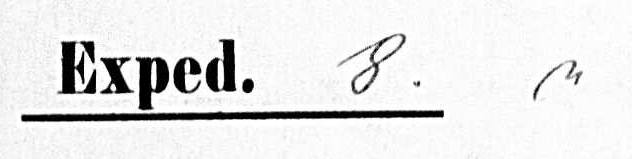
Expedit 8. Februar
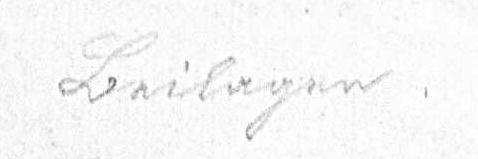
Beilagen
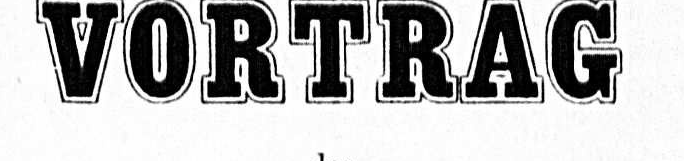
VORTRAG
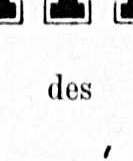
Des
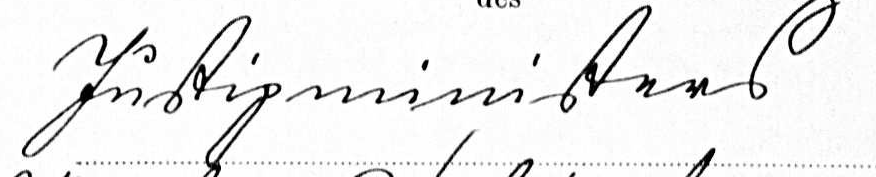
Justizministers
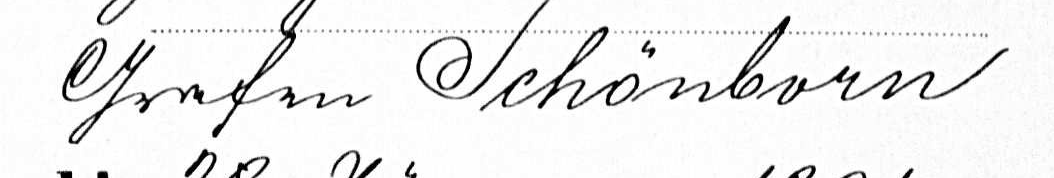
Grafen Schönborn
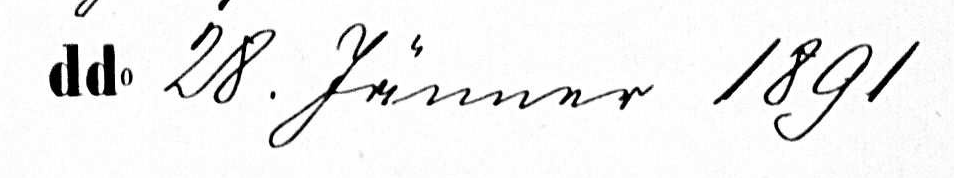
Ddo 28 Jänner 1891
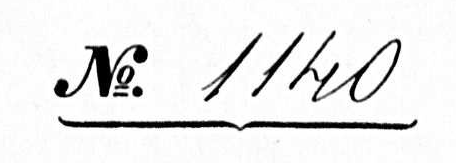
No 1140
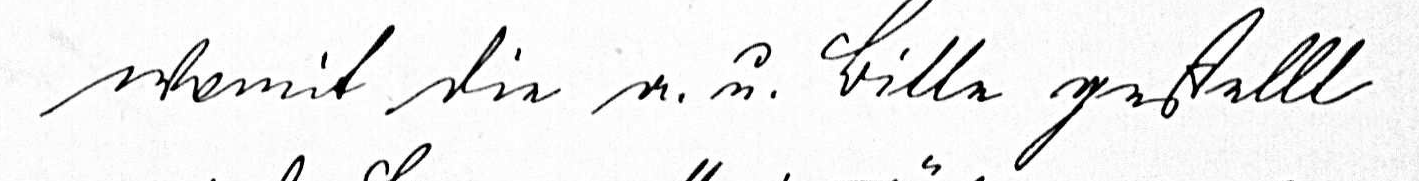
Womit die a. u. Bitte gestellt
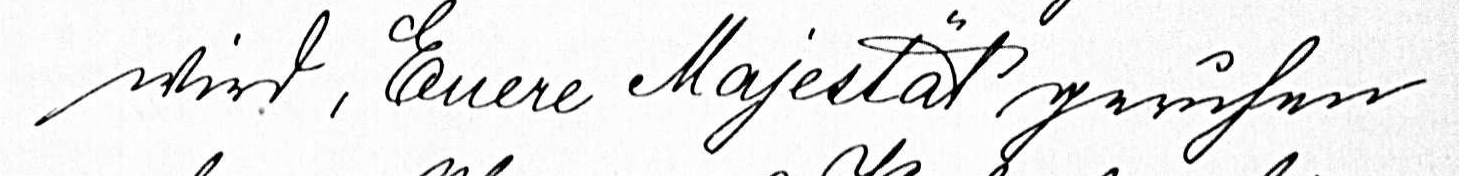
wird, Euere Majestät geruhen
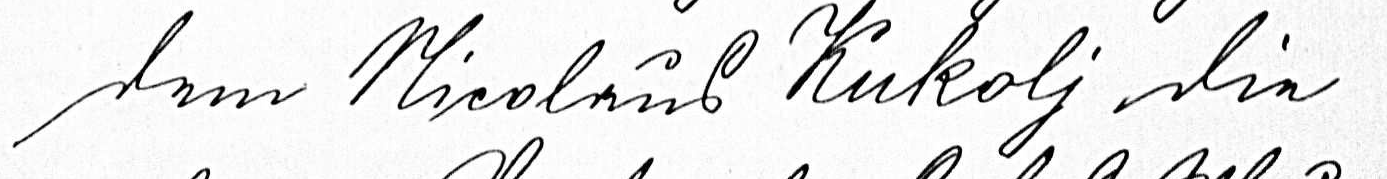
dem Nicolaus Kukolj die
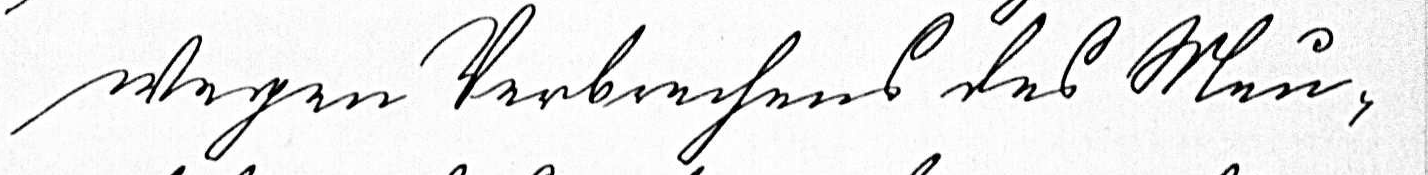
wegen Verbrechens des Meu¬
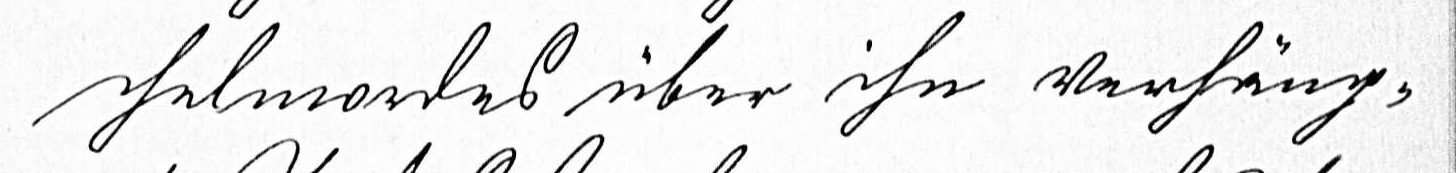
chelmordes über ihn verhäng¬
